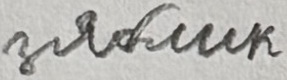зяблик
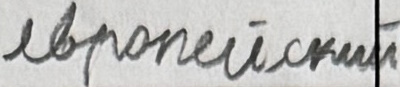европейский
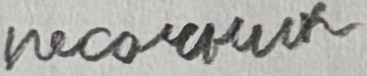песочник
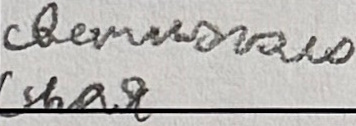светлоголосвая
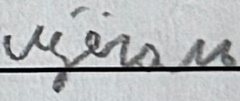щёголь
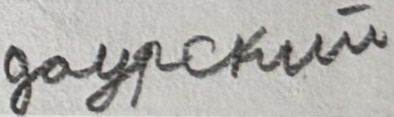даурский
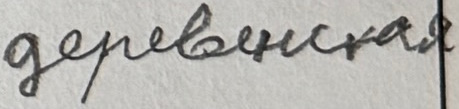деревенская
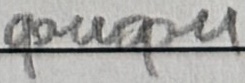фифи
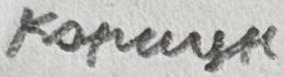кориун
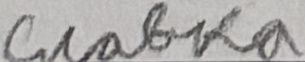славка
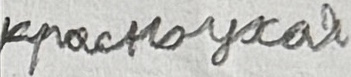красноухая
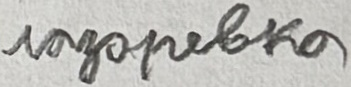лазоревка
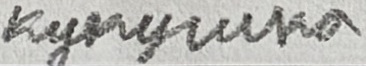кукушка
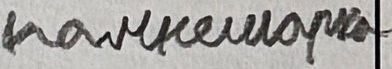камнешарка
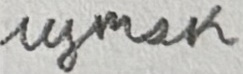лутак
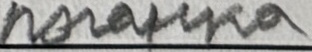поганка
